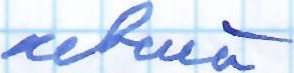певчий
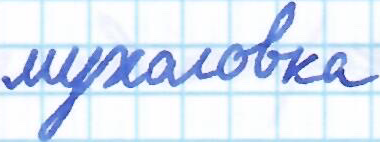мухоловка
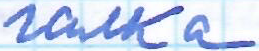галка
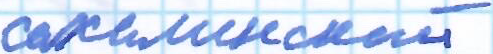сахалинский
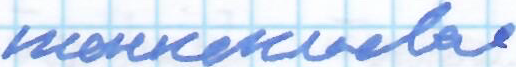тонкоклювая
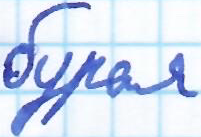бурая
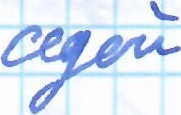седой
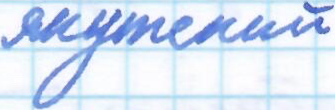якутский
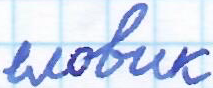еловик
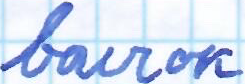волчок
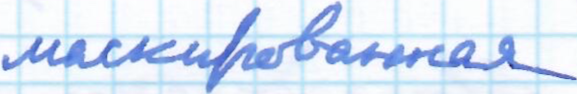маскированная
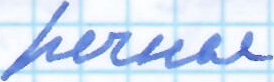речная
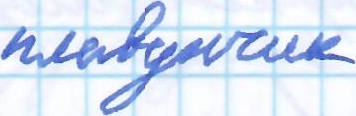плавунчик
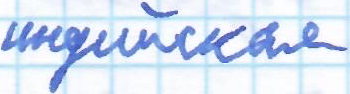индийская
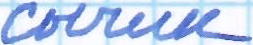сычик
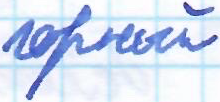горный
